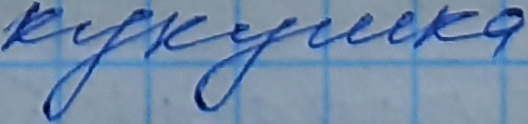кукушка
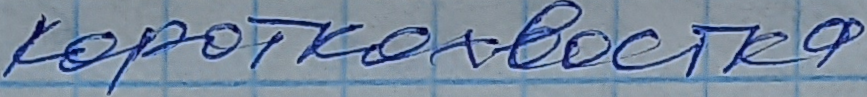короткохвостка
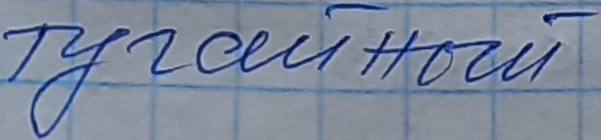тугайный
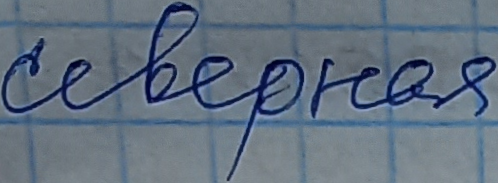северная
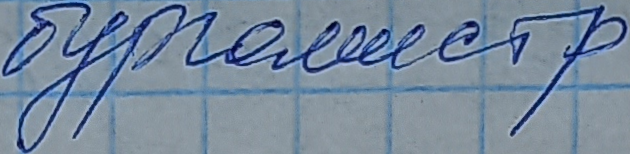бургомистр
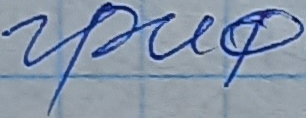гриф
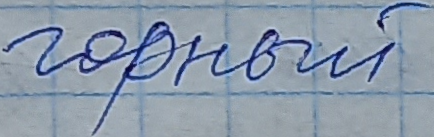горный
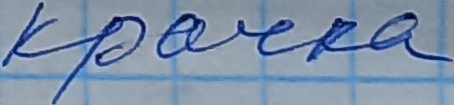крачка
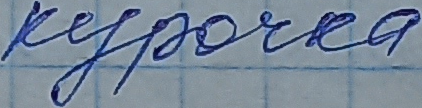курочка
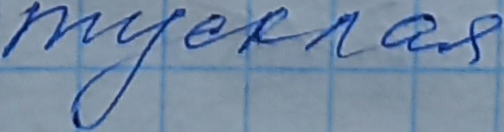тусклая
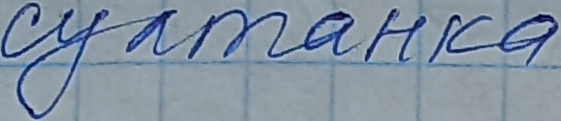султанка
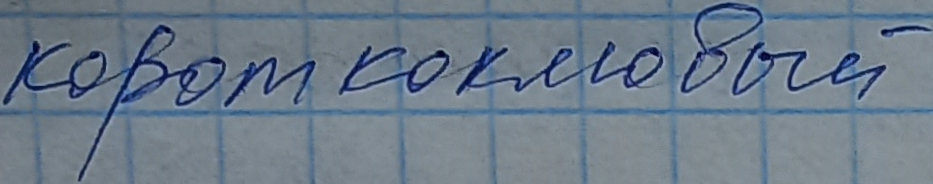короткоклювый
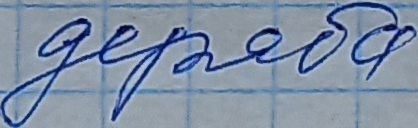деряба
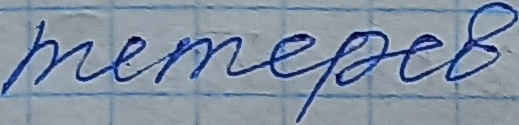тетерев
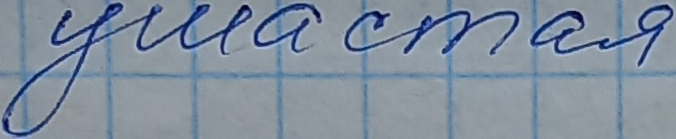ушастая
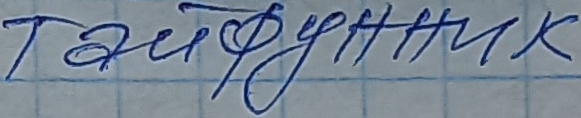тайфунник
